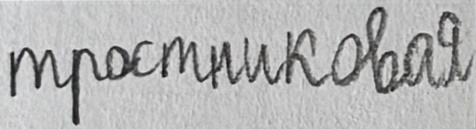тростниковая
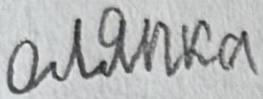оляпка
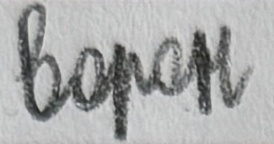ворон
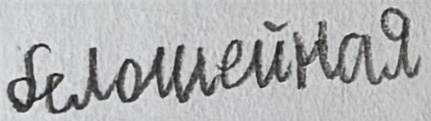белошейная
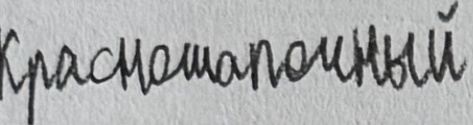красношапочный
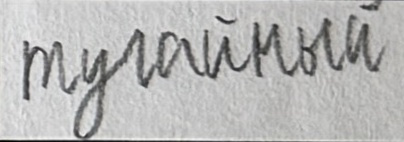тугайный
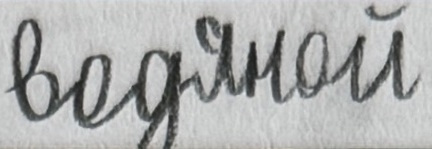водяной
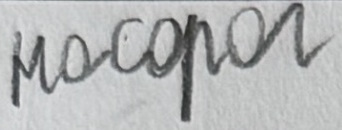носорог
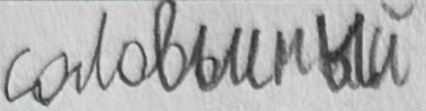соловьиный
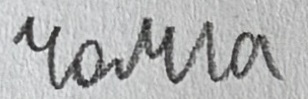чомга
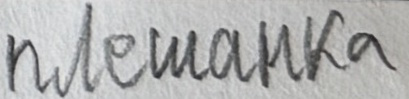плешанка
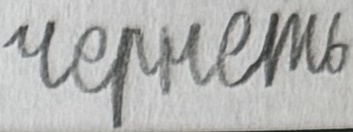чернеть
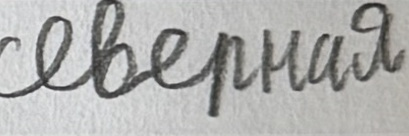северная
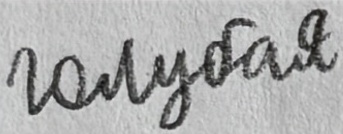голубая
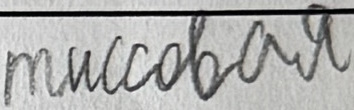тиссовая
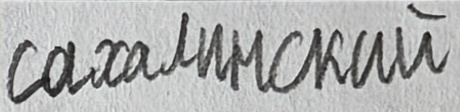сахалинский
